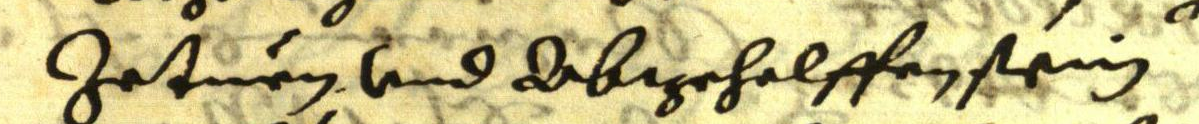Zetūen vnd Abzehelffen sein
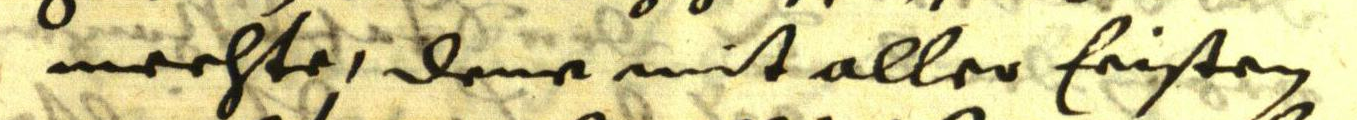mechte, deme mit aller Eeisten
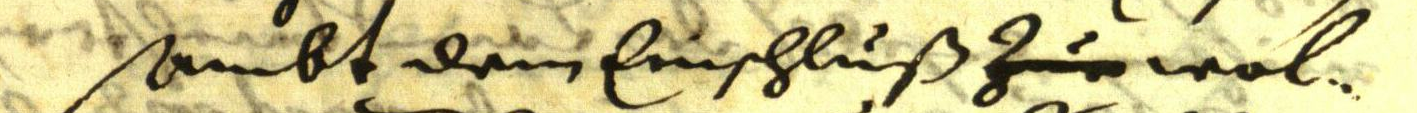sambt dem Einschlūß Zūe wol¬
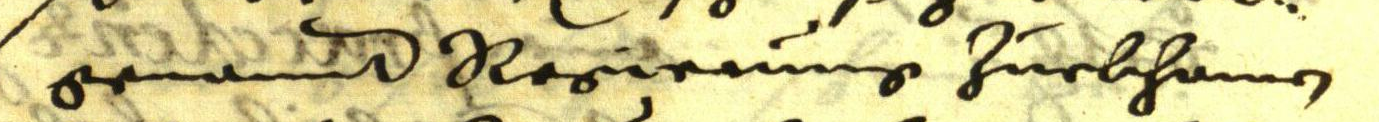genannt Regierūng Zūekhomen
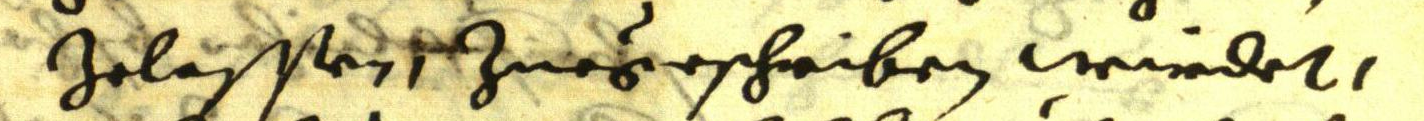Zelassen, Zūegeschriben wirdet,
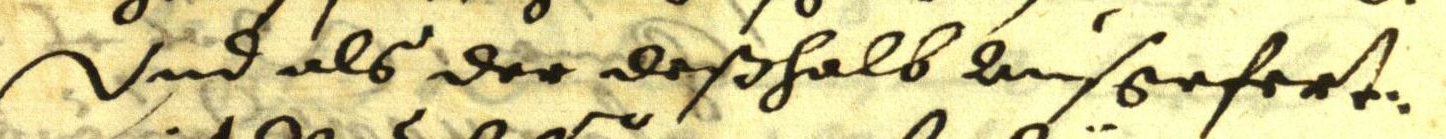Vnd als der deßhalb Aūsgefert¬
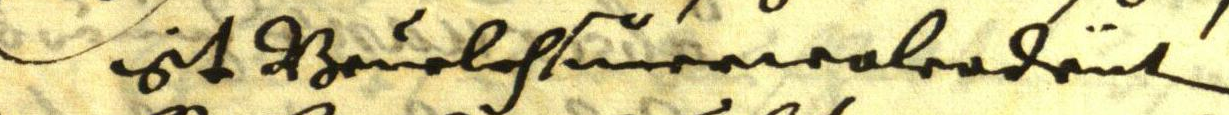igt Beūelch merwoleodeüt
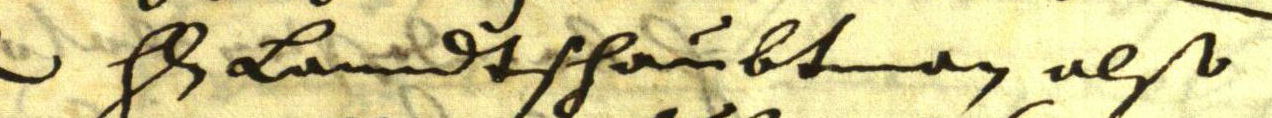hln Lanndtshaūbtman also
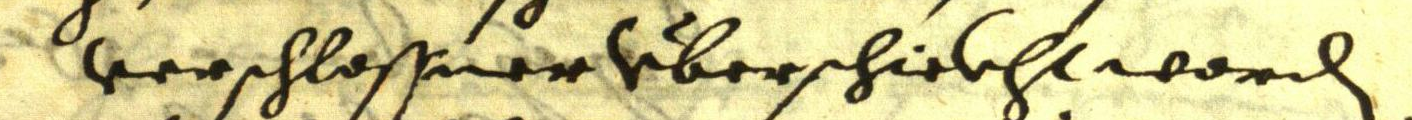verschlossner v̄berschickht word.
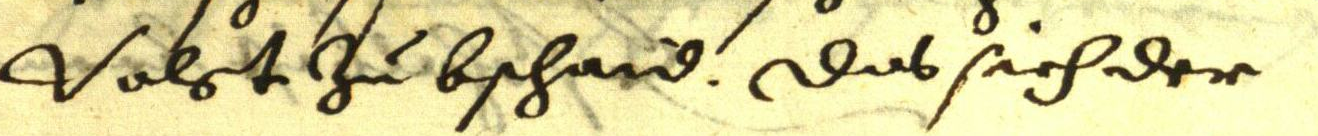Volgt Zū bschaid. das sich der
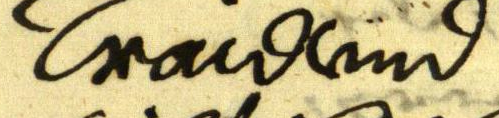Traid vnd
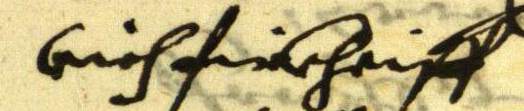vieh firkhaūff
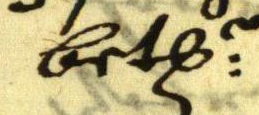bet:
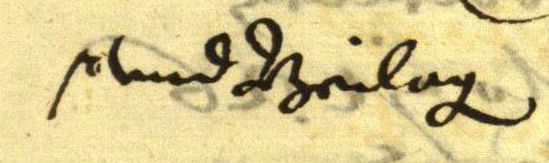vnd Beilag
